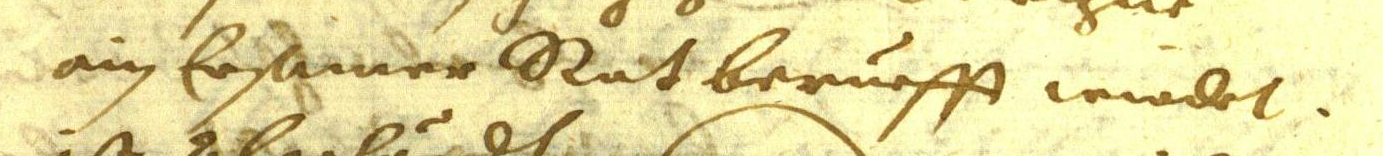ain Ersamer Rat berūefft wirdet.
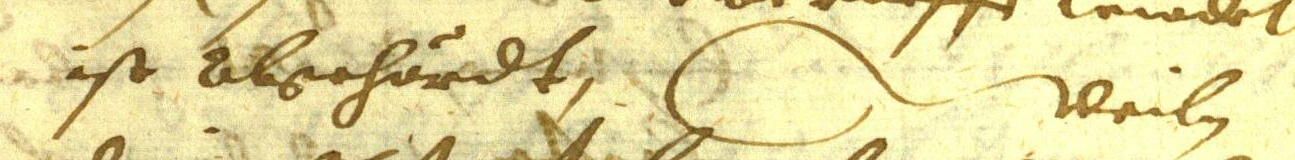ist Abgehōrdt, Weiln
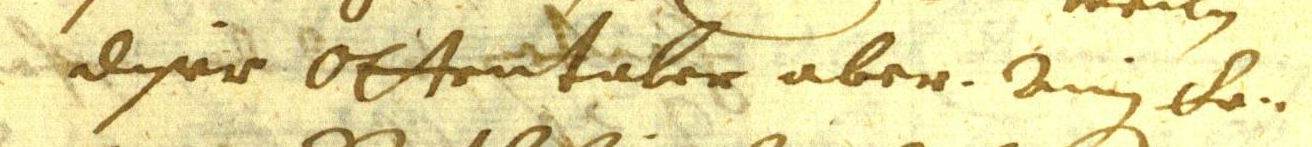diser Ottentaler aber. Aim Er¬
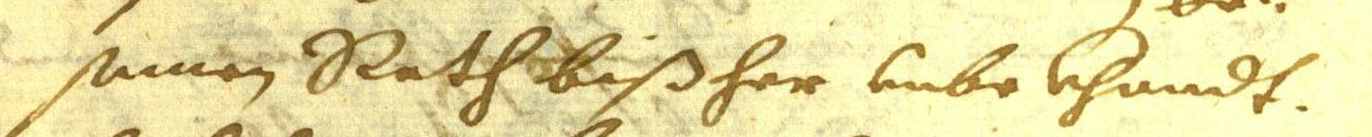samen Rath biß her vnbe khandt.
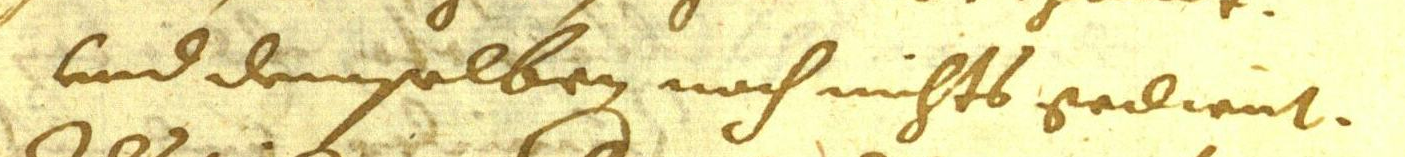vnd demselben noch nichts gedient.
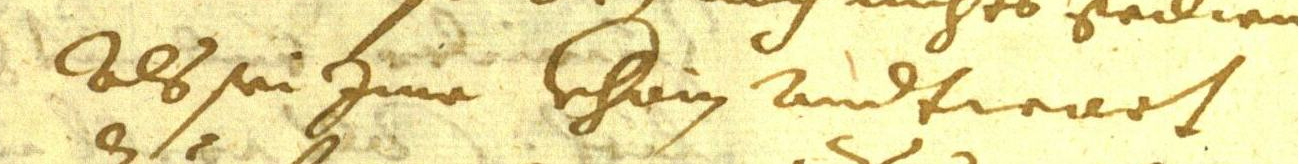Als sei Ime khain Andtwort
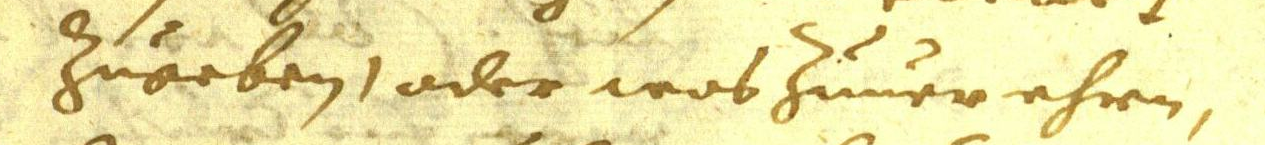Zūgeben, oder was Zūūer ehrn,
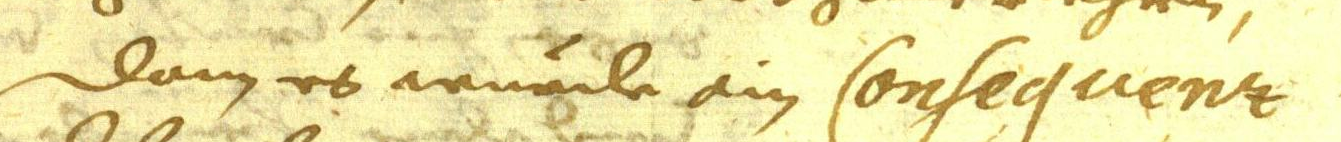dann es wūrde ain Consequenz
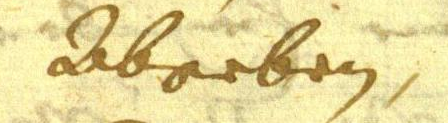Abgeben,
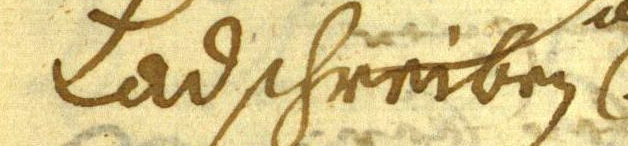Lad schreiben
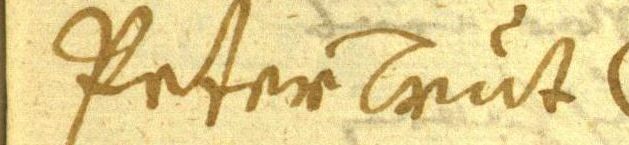Peter Trūt
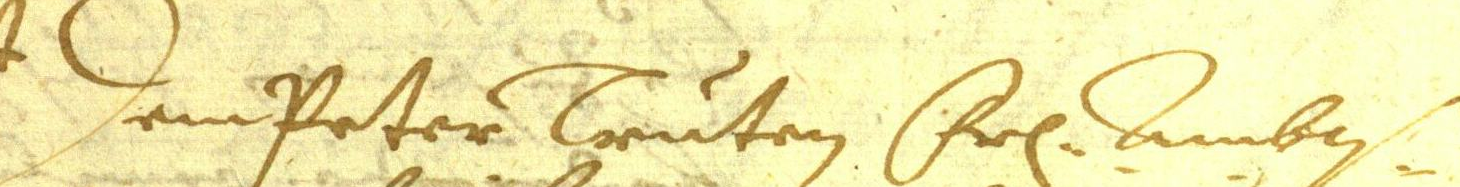Dem Peter Trūten Frl: Ambts¬
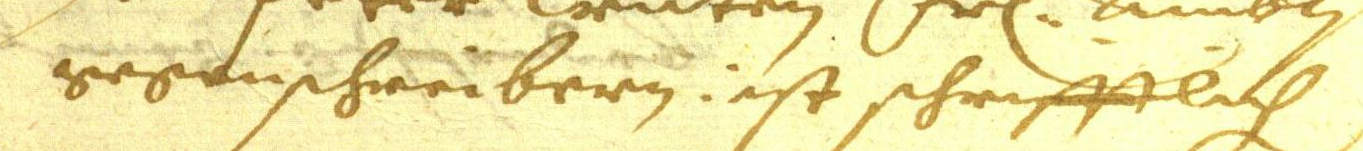gegenschreibern. ist schrifftlich
